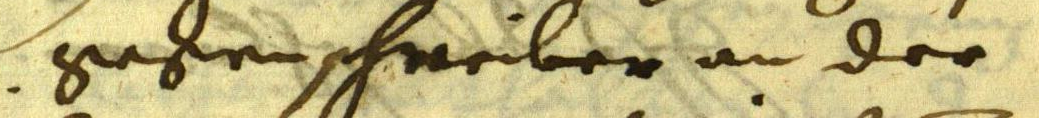gegenschreiber an der
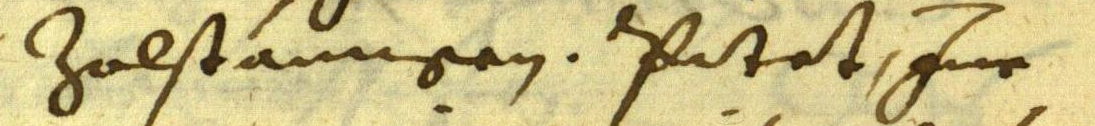Zolstanngen. Pitet Ime
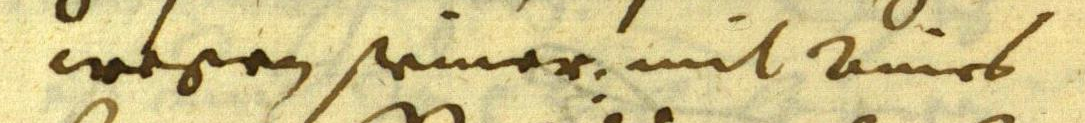wegen seiner: mit Aines
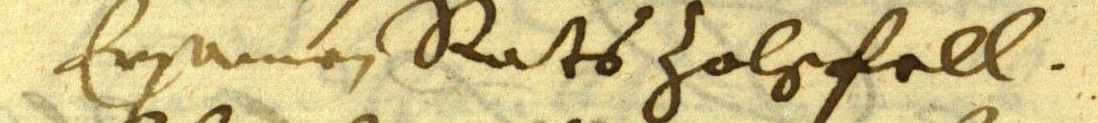Ersamen Rats Zolgfell.
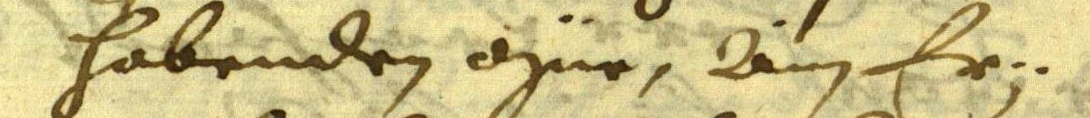habenden Müe, Ain Er¬
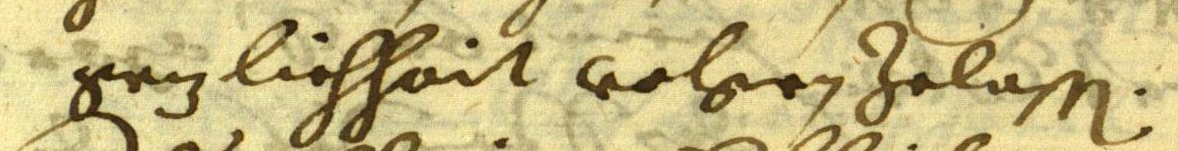gezlichhait volgen Zelass.
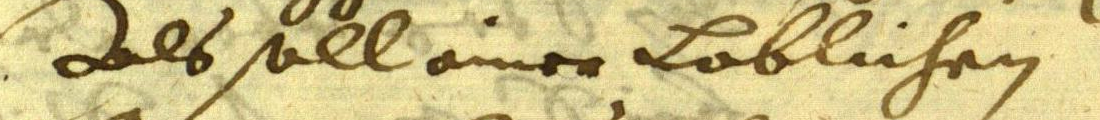Als soll ainer Loblichen
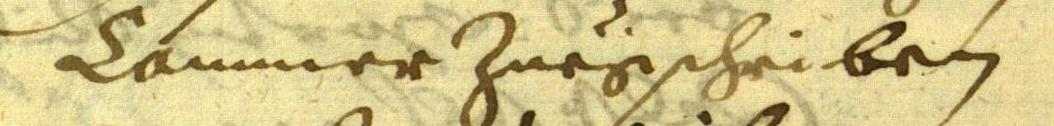Cammer Zūegeschriben
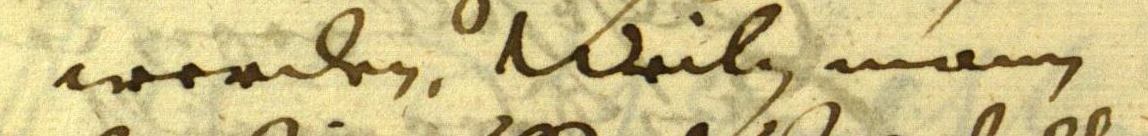werden. Weiln mann
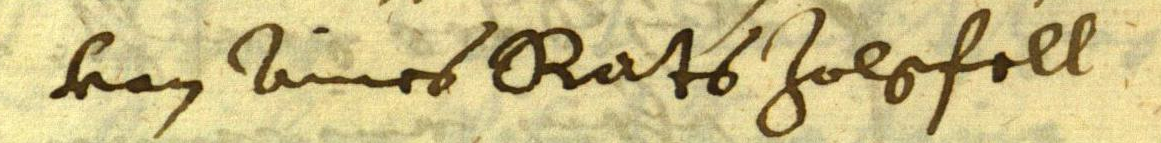von Aines Rats Zolgfell
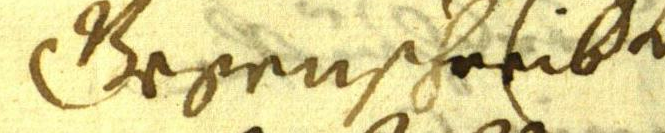Gegenschreib
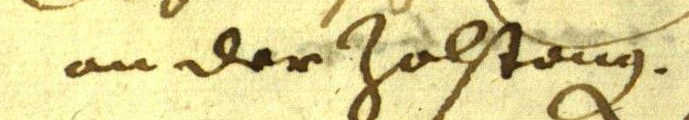an der Zolstang.
